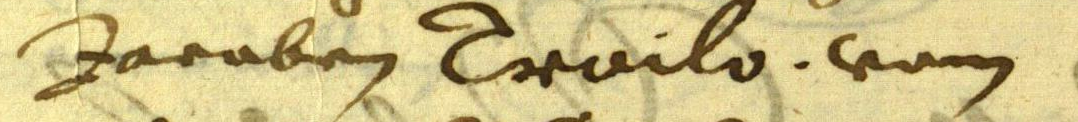Jacoben Troilo. vom
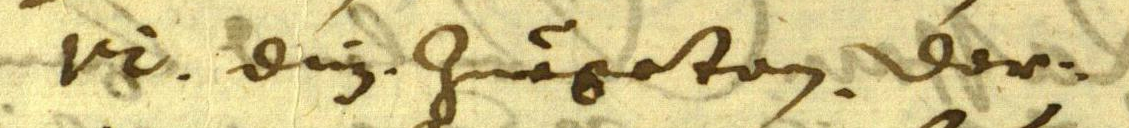12. diz. Zūegetan. dar¬
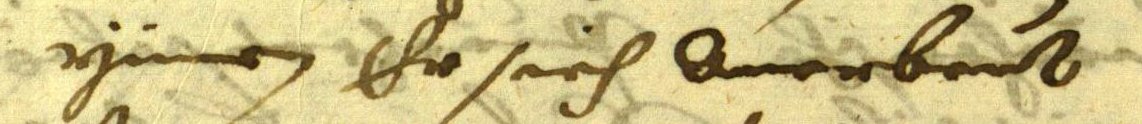ÿnnen Er sich Anerbeūt
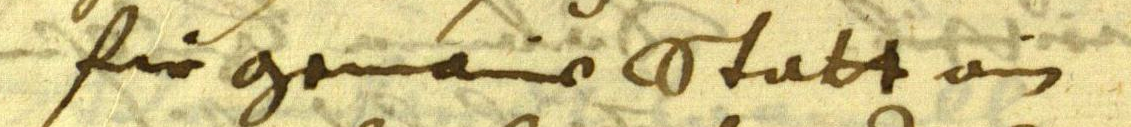fir gemaine Statt ain
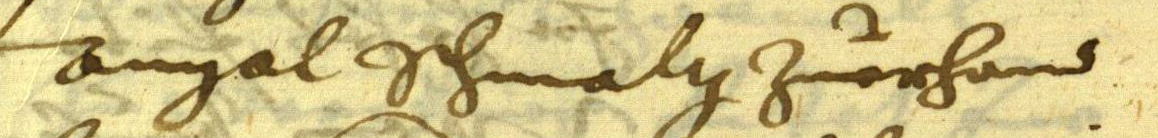Annzal Schmalz Zūerhand¬
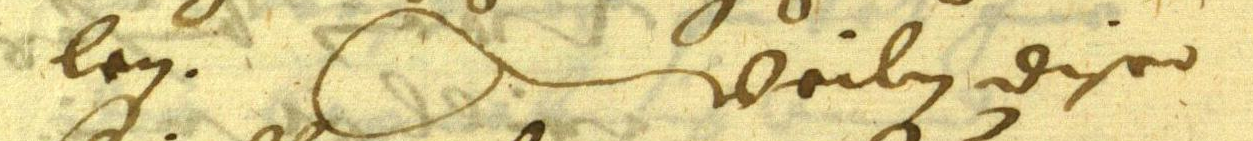len. Weiln diser
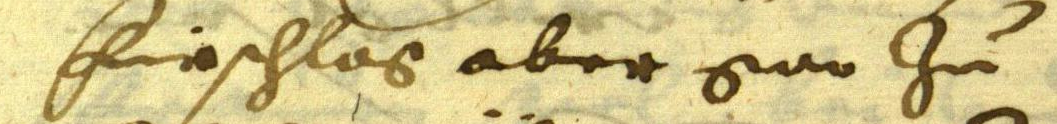Firschlag aber gar Zū
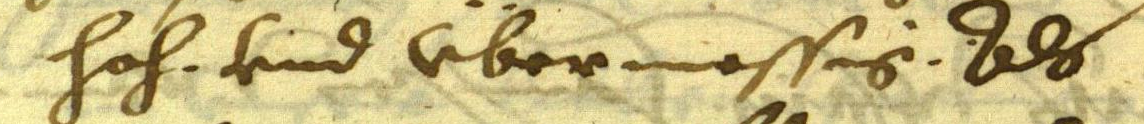hoh. vnd v̈bermessig. Als
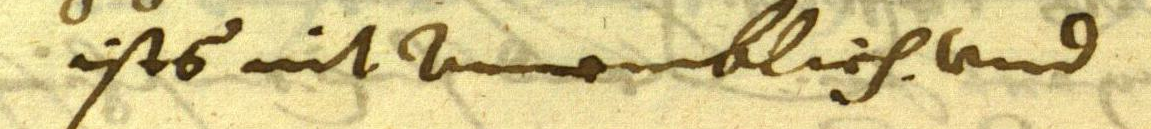ists nit Annemblich. vnd
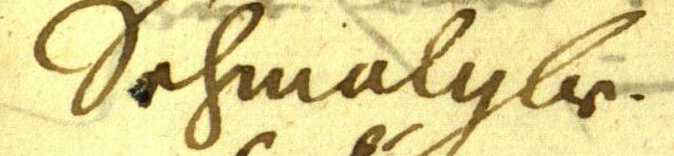Schmalz be¬
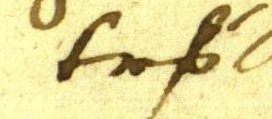tr.
